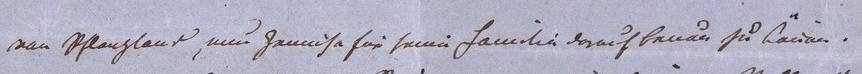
von Pflanzland, um Gemüse für seine Familie darauf bauen zu können.
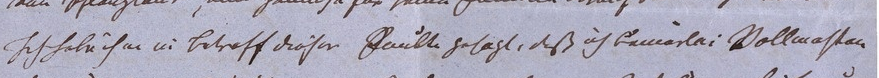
Ich habe ihm in Betreff dieser Punkte gesagt, daß ich keinerlei Vollmachten
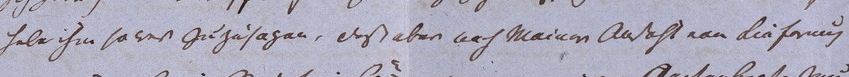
habe ihm so was zuzusagen, daß aber nach meiner Ansicht von Lieferung
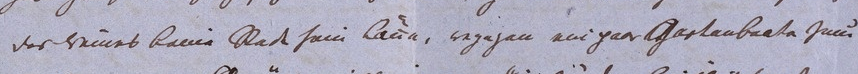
des Weines keine Rede sein könne, wogegen ein par Gartenbeete zum
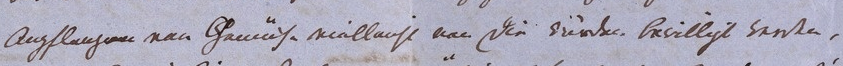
Anpflanzen von Gemüse vielleicht von Dir würden bewilligt werden,
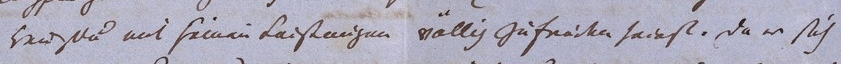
wenn Du mit seinen Leistungen völlig zufrieden seiest. Da er sich
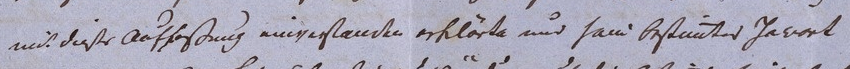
mit dieser Auffaßung einverstaden erklärte und sein bestimmtes Jawort
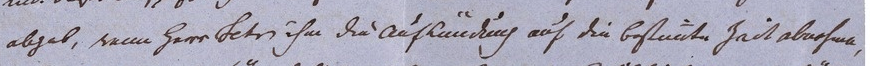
abgab, wenn Herr Lehr ihm die Aufkündung auf die bestimmte Zeit abnehme,
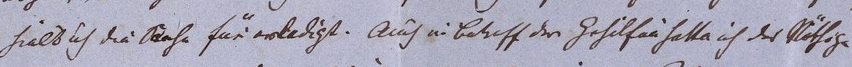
hielt ich die Sache für erledigt. Auch in Betreff des Gehilfen hatte ich das Nöthige
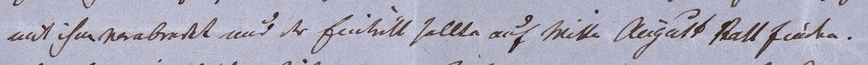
mit ihm verabredet und der Eintritt sollte auf Mitte August Statt finden.
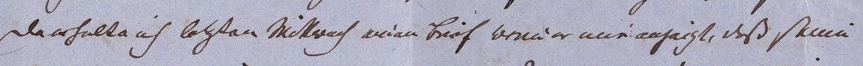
Da erhalte ich letzten Mittwoch einen Brief worin er nun anzeigt, daß seine
